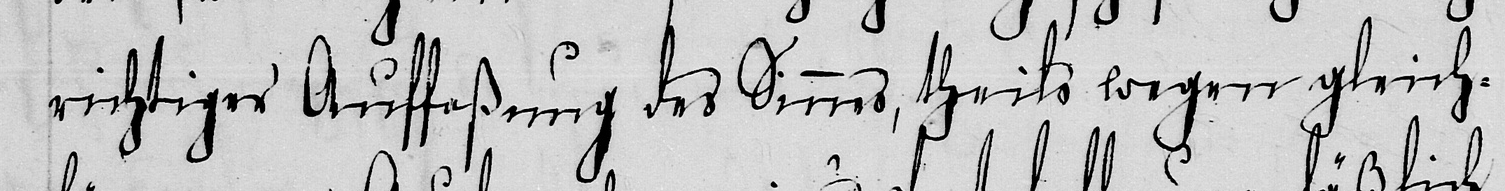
richtiger Auffaßung des Sinnes, theils wegen gleich¬
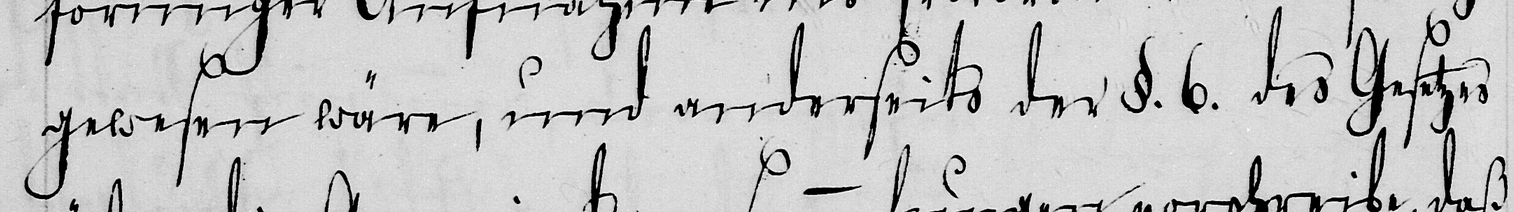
gewesen wäre, und anderseits der §. 6. des Gesetzes
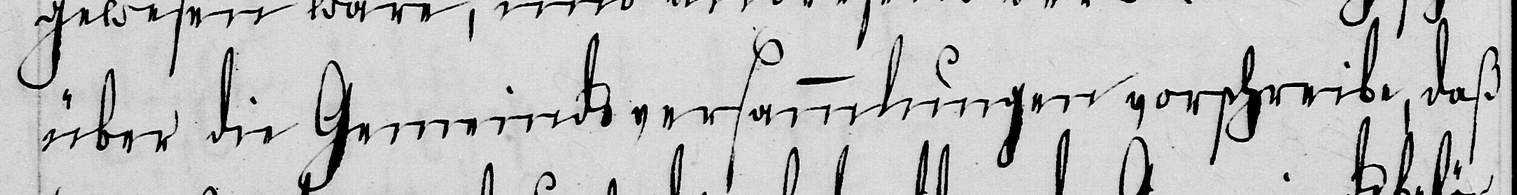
über die Gemeindsversammlungen vorschreibe, daß
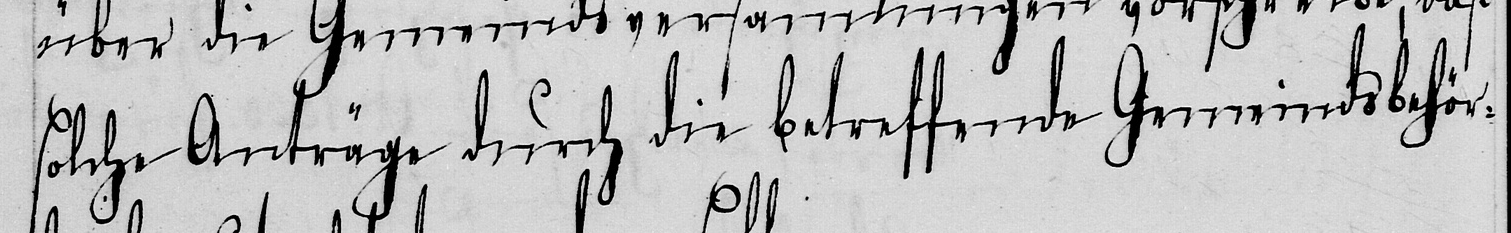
solche Anträge durch die betreffende Gemeindsbehör¬
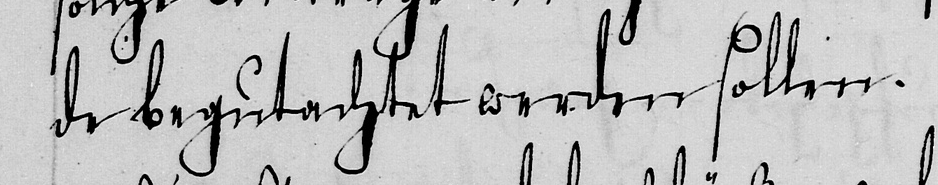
de begutachtet werden sollen.
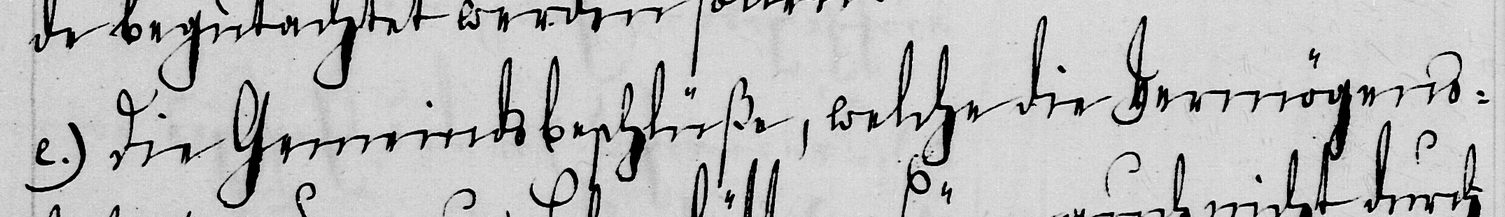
e.) Die Gemeindsbeschlüße, welche die Vermögens¬
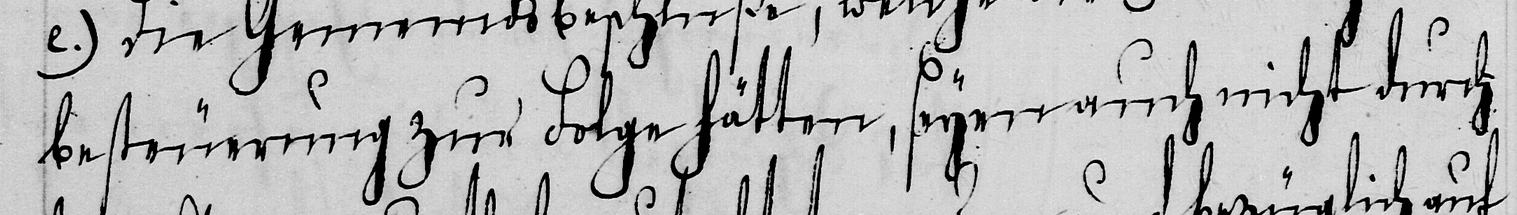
besteuerung zur Folge hätten, seyen auch nicht durch
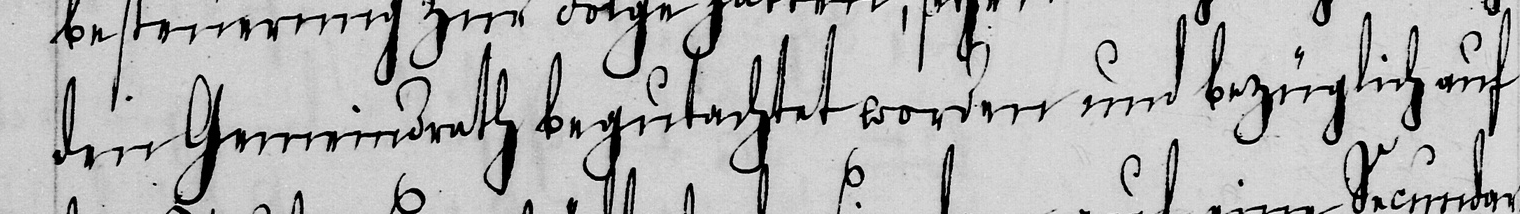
den Gemeindrath begutachtet worden und bezüglich auf
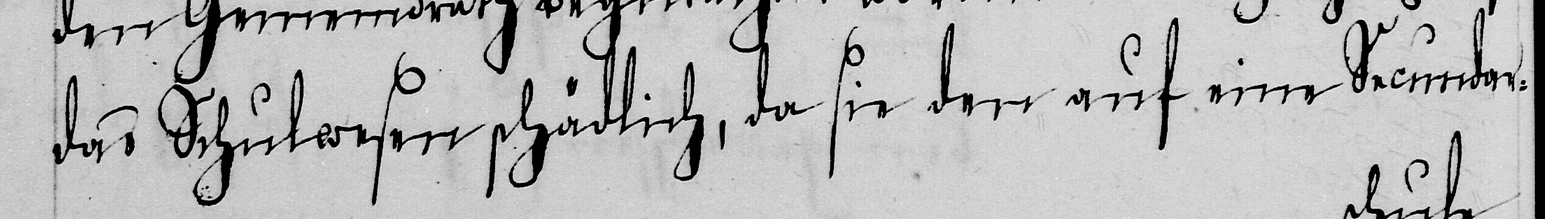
das Schulwesen schädlich, da sie den auf eine Secunda¬
